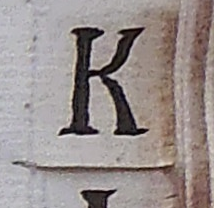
K
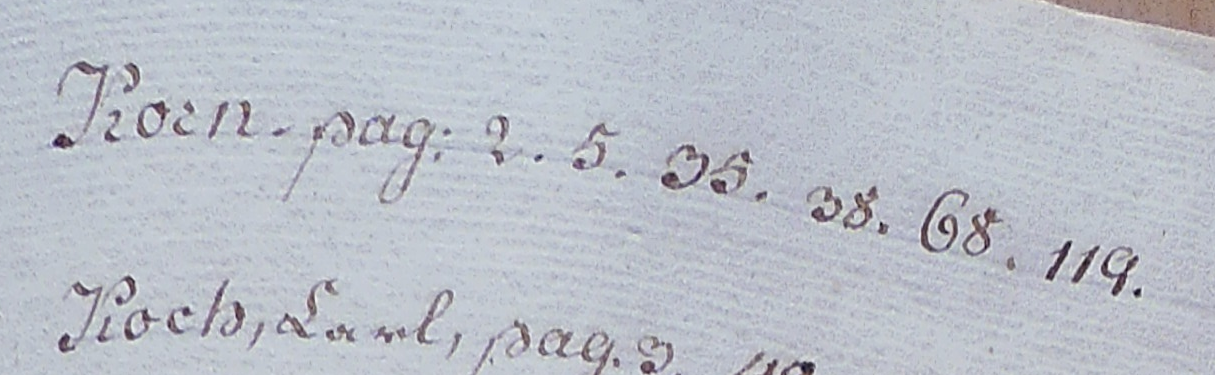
Korn. pag: 2. 5. 35. 38. 68. 119.
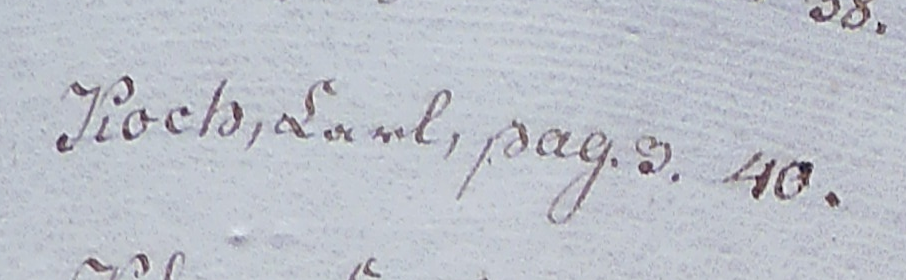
Koch, Carl, pag. 3. 40.
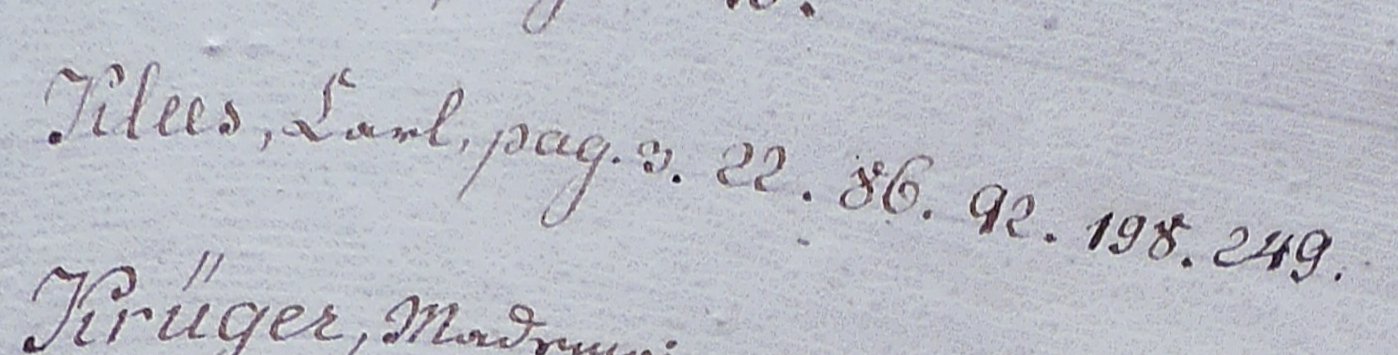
Klees, Carl, pag. 3. 22. 86. 92. 198. 249.
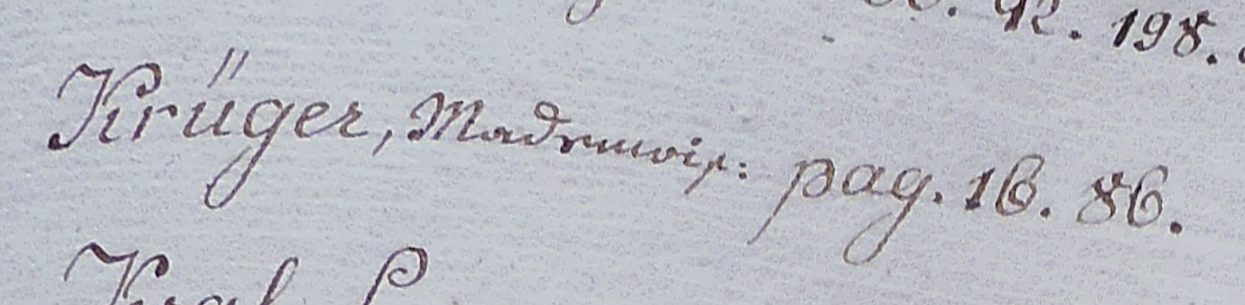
Krüger, Mademois: pag. 16. 86.
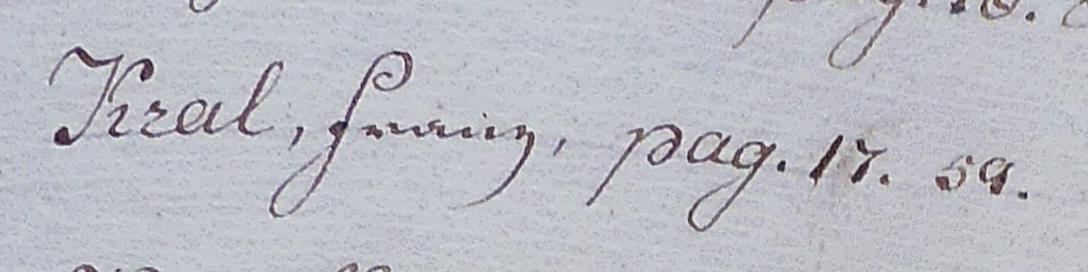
Kral, Franz, pag. 17. 59.
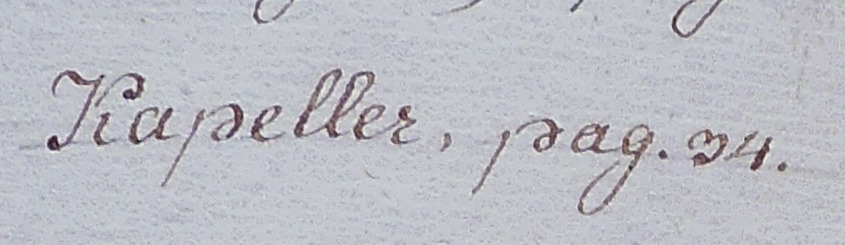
Kapeller, pag. 34.
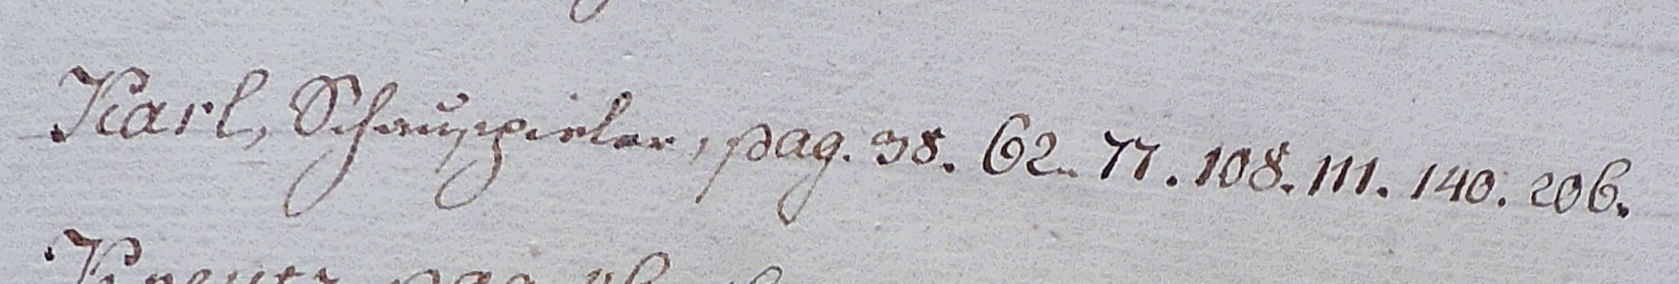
Karl, Schauspieler, pag. 38. 62. 77. 108. 111. 140. 206.
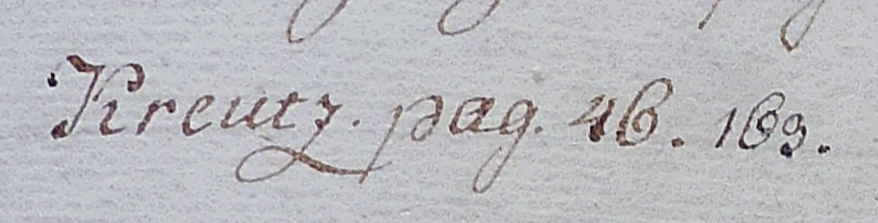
Kreutz. pag. 46. 163.
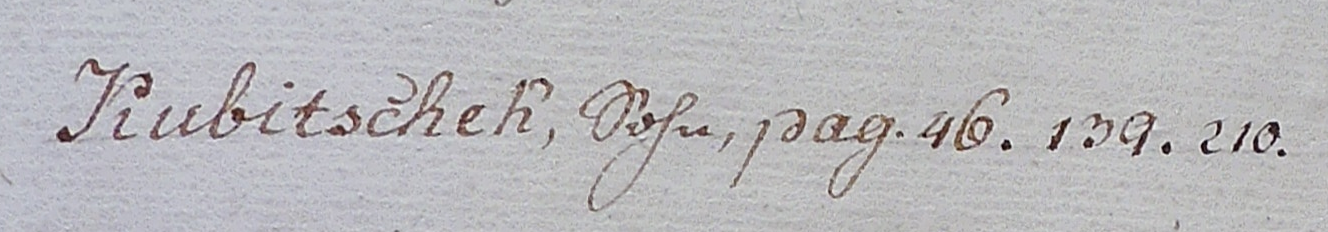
Kubitschek, Sohn, pag. 46. 139. 210.
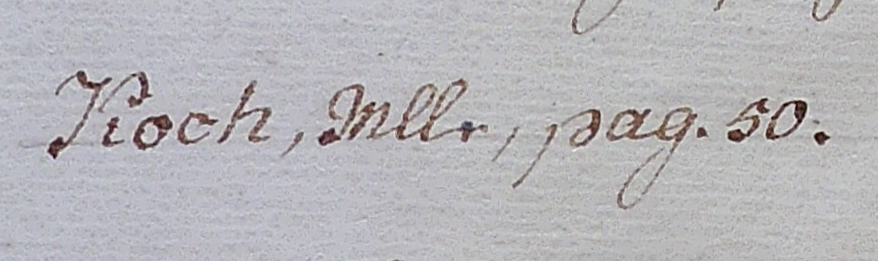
Koch, Mlle, pag. 50.
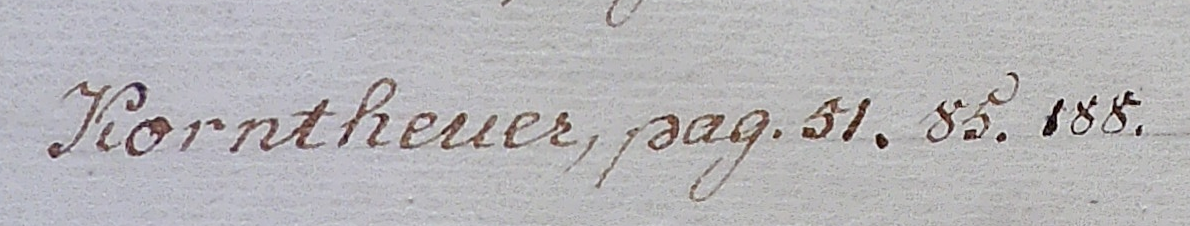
Korntheuer, pag. 51. 85. 188.
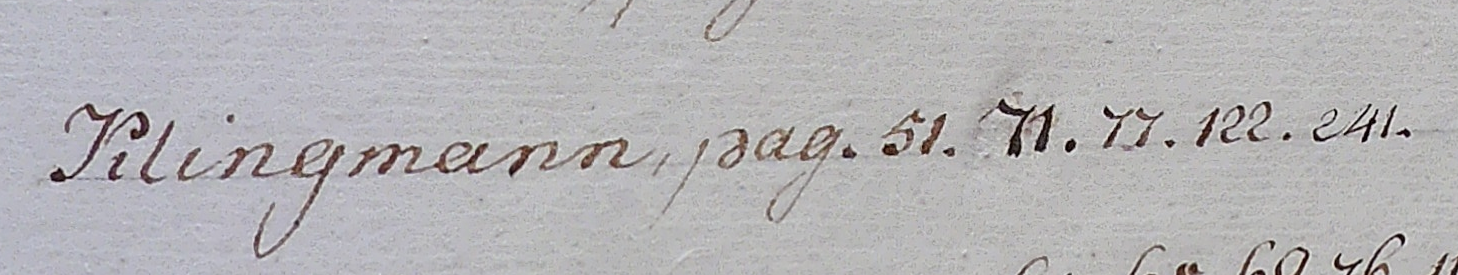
Klingmann, pag. 51. 71. 77. 122. 241.
